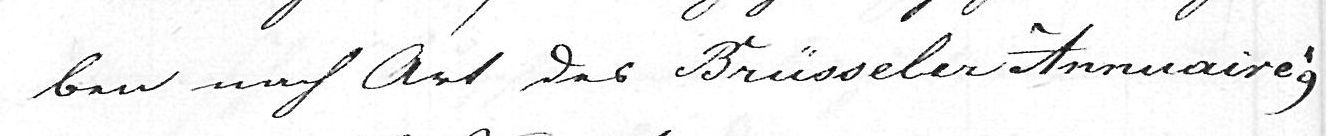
ben nach Art der Brüsseler Annuaire's
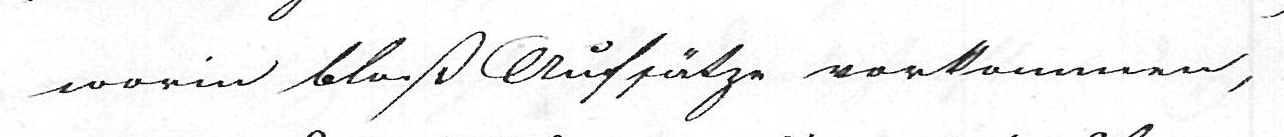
worin bloß Aufsätze vorkonmen,
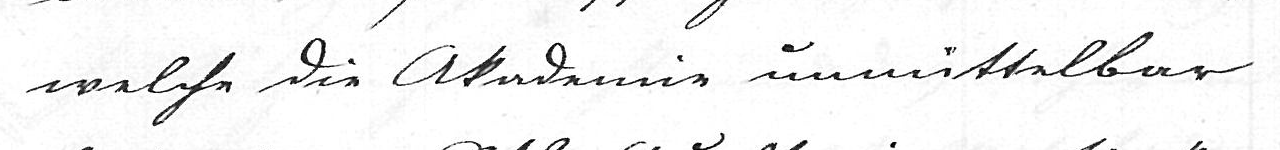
welche die Akademie unmittelbar
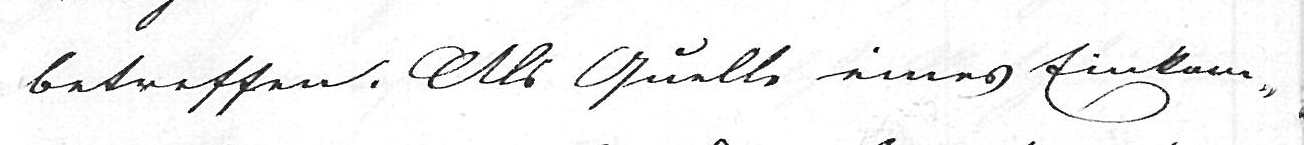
betreffen. Als Quelle eines Einkom-
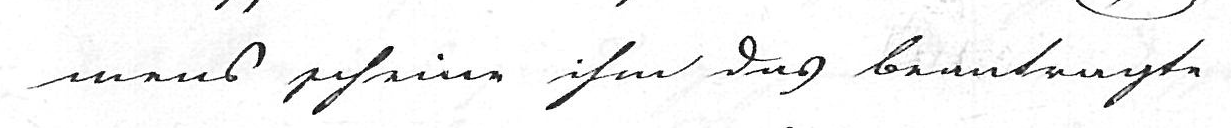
mens scheine ihm das beantragte
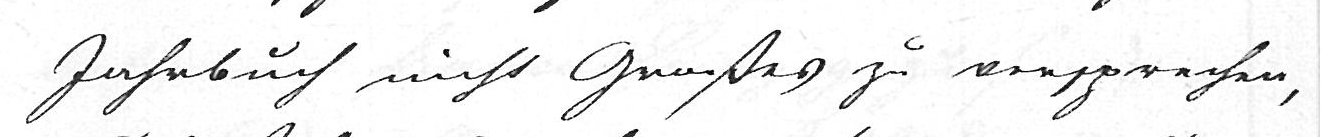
Jahrbuch nicht Großes zu vorsprechen,
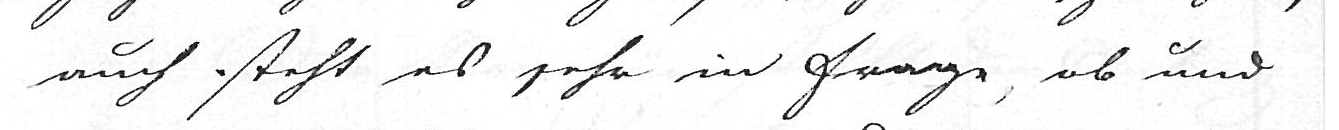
auch steht es sehr in Frage, ob und
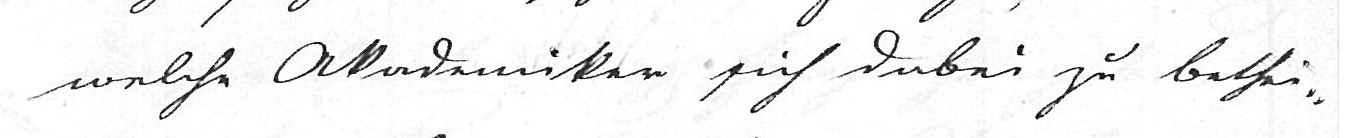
welche Akademiker sich dabei zu bethei-
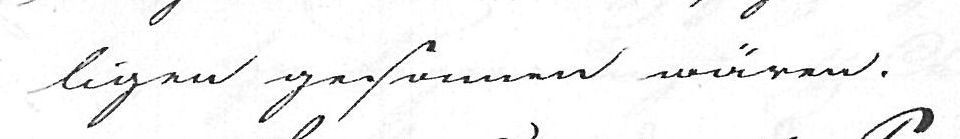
ligen gesonnen wären.
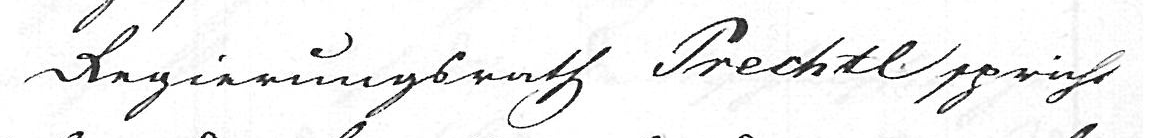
Regierungsrath Prechtl spricht
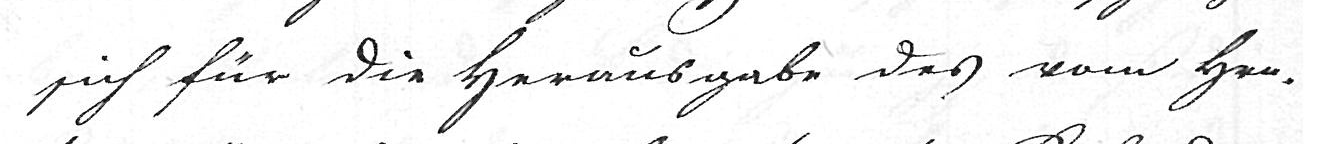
sich für die Herausgabe des von Hrn.
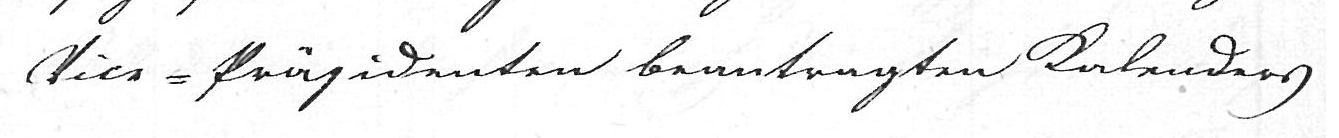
Vice-Präsidenten beantragten Kalenders
